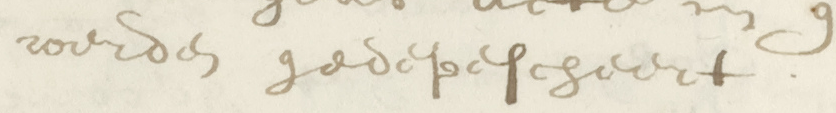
worden gedepescheert
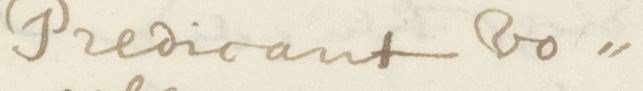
Predicant vo„
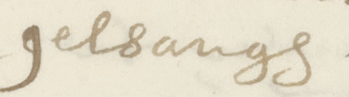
gelsangh
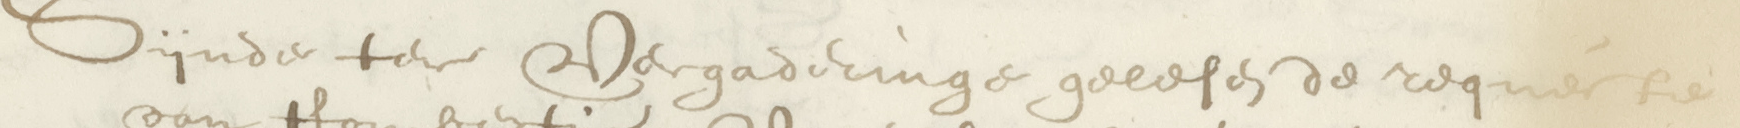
Sijnde ter Vergaderinge gelesen de requeste
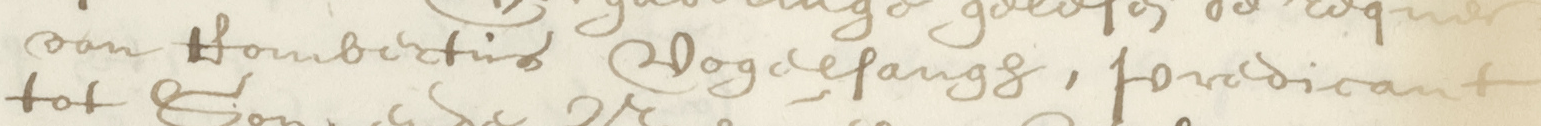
van Rombertus Vogelsangh, predicant
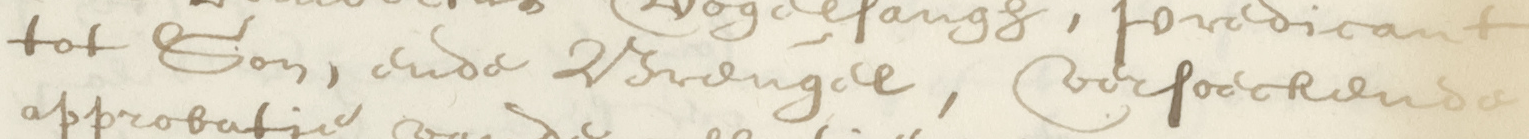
tot Son, ende Brengel, versoeckende
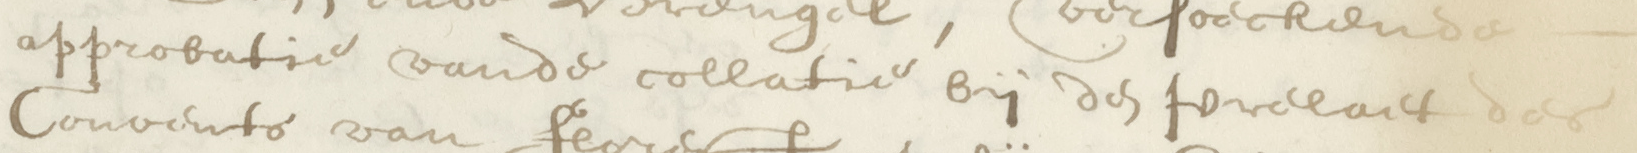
approbatie vande collatie bij des prelaet des
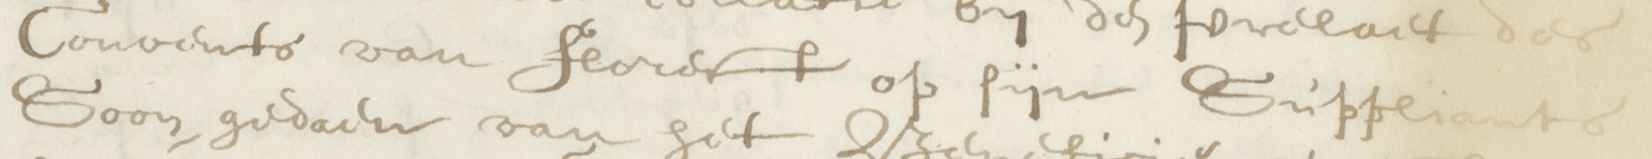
Convents van Floreff op sijn suppliants
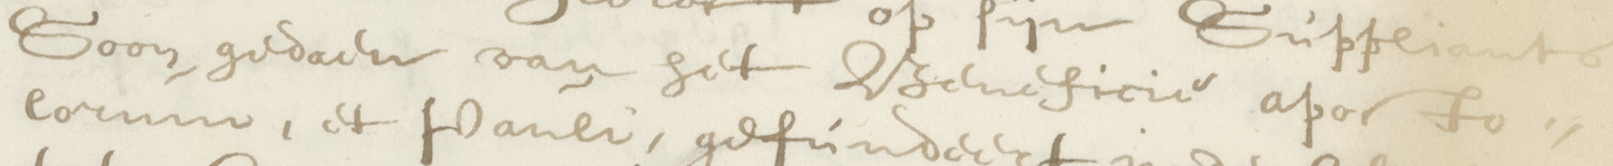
Soon gedaen van het Beneficie aposto„
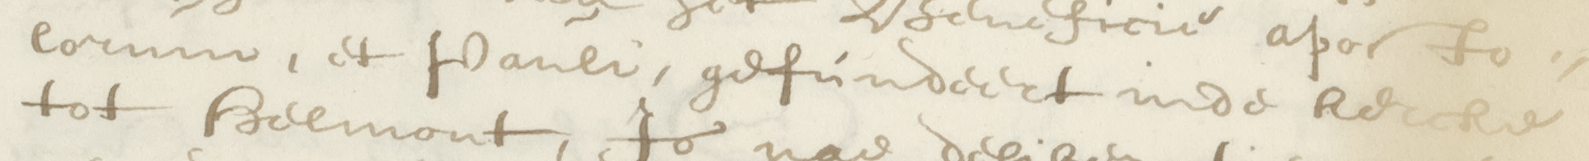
lorium, et Pauli, gefundeert inde kercke
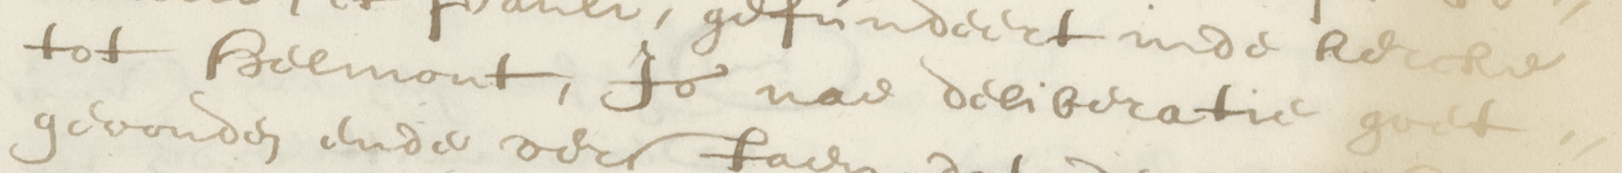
tot Helmont, Is nae deliberatie goet„
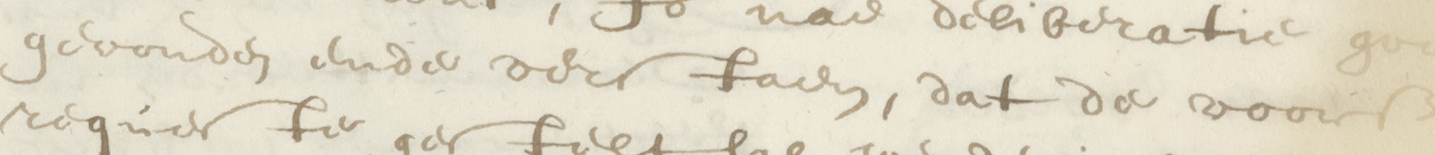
gevonden ende verstaen, dat de voors
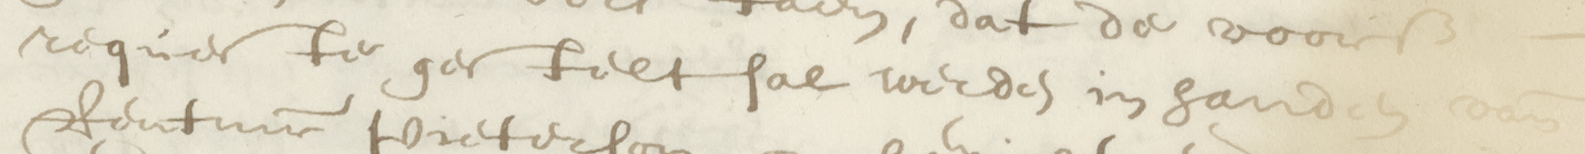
requeste gestelt sal werden in handen van
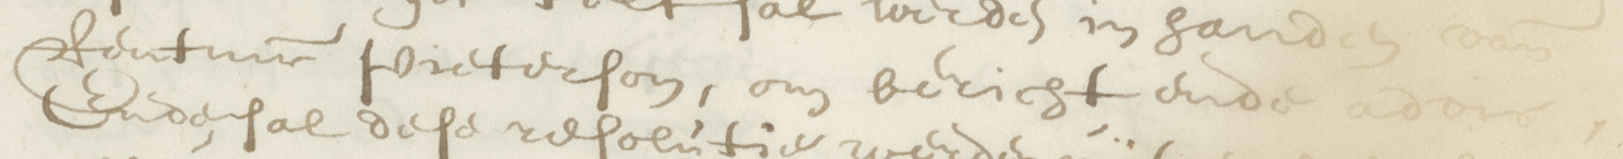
Rentmr Pieterson, om bericht ende advis,
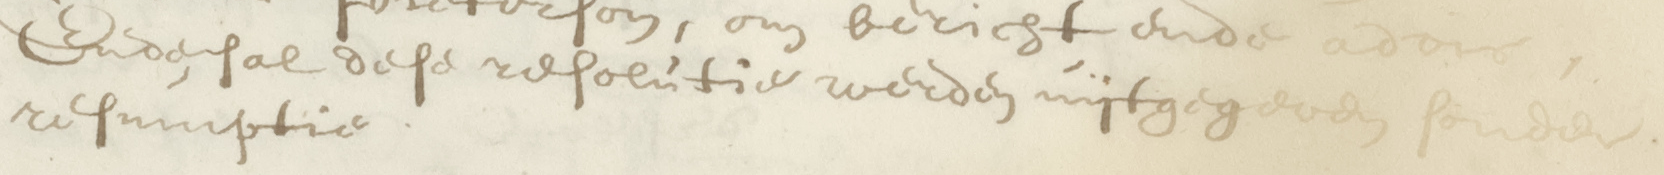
Ende sal dese resolutie werden uijtgegeven sonder
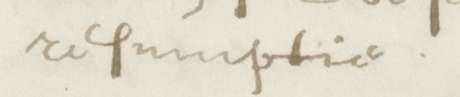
resumptie.
